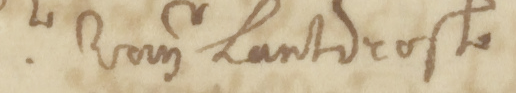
Lt. van Lantdroste
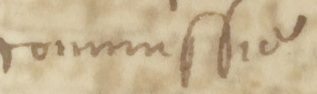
commissie
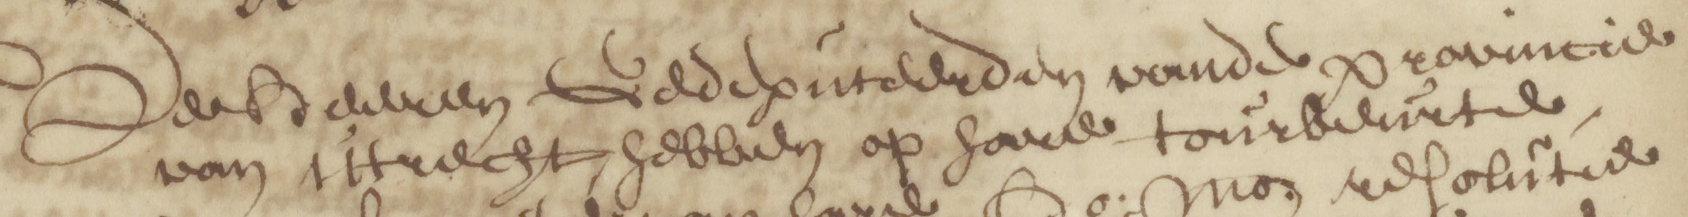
De Heeren Gedeputeerden vande provincie
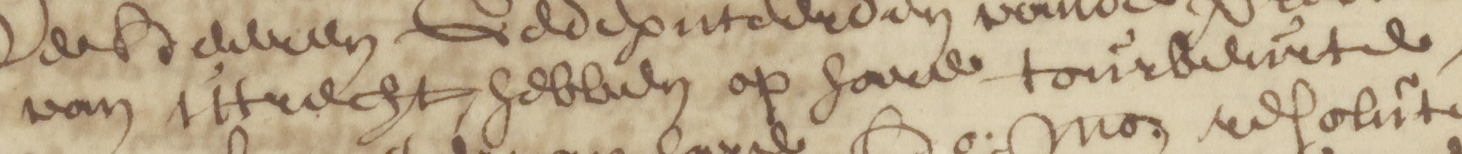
van Utrecht, hebben op hare tourbeurte
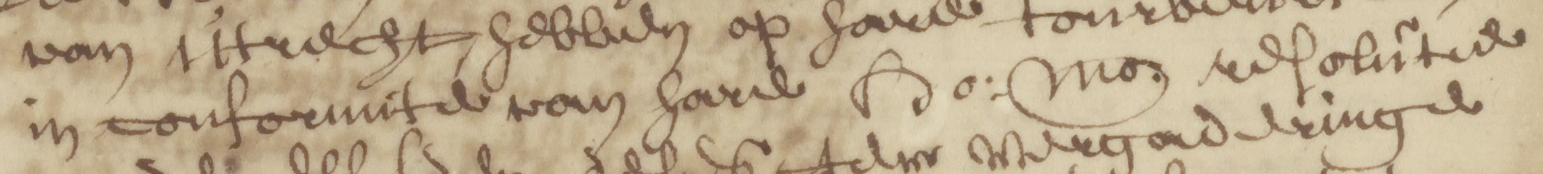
in conformite van hare Ho:Mo: resolutie
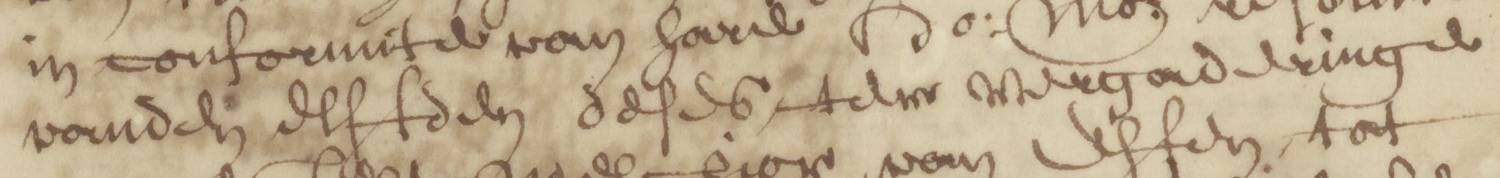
vanden elffden deses, ter Vergaderinge
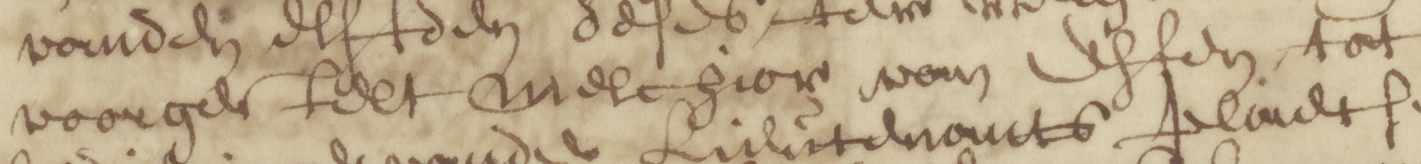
voorgestelt Melchior van Effen, tot
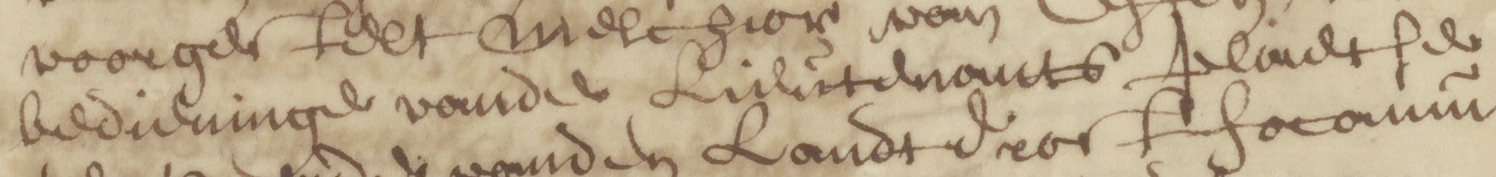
bedieninge vande Lieutenants plaetse
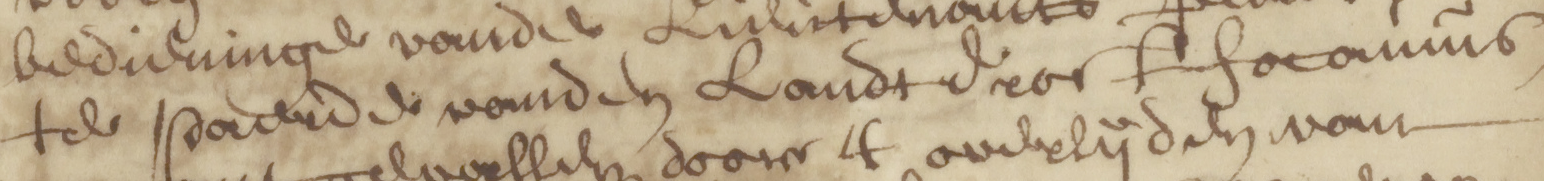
te paerde vanden Landt drost Focanius,
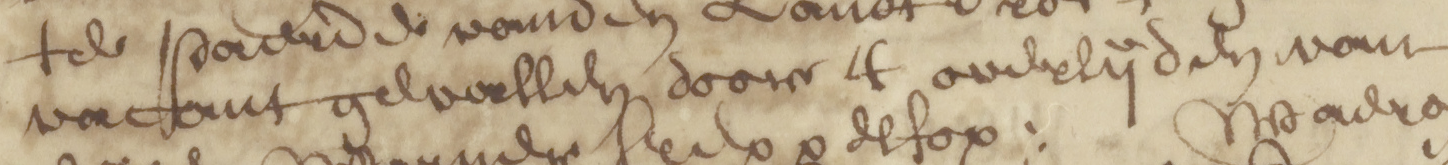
vacant gevallen door 't overlijden van
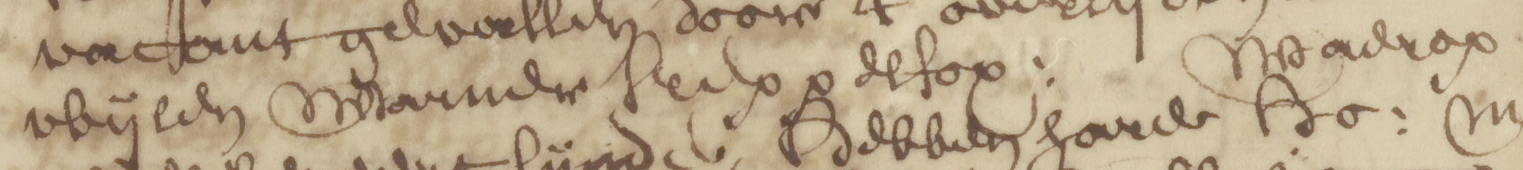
wijlen Warner Keppelfox: Waerop
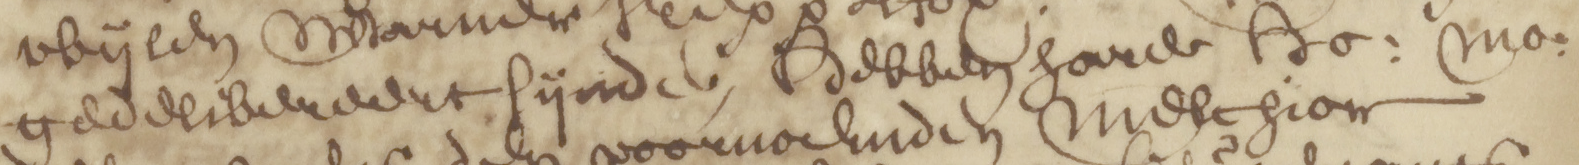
gedelibereert sijnde, hebben hare Ho:Mo:
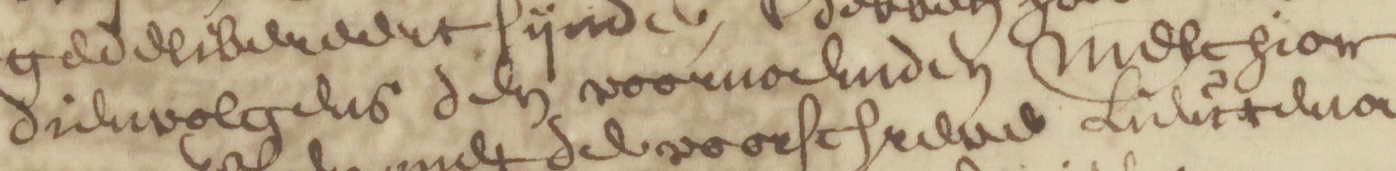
dienvolgens den voornoemden Melchior
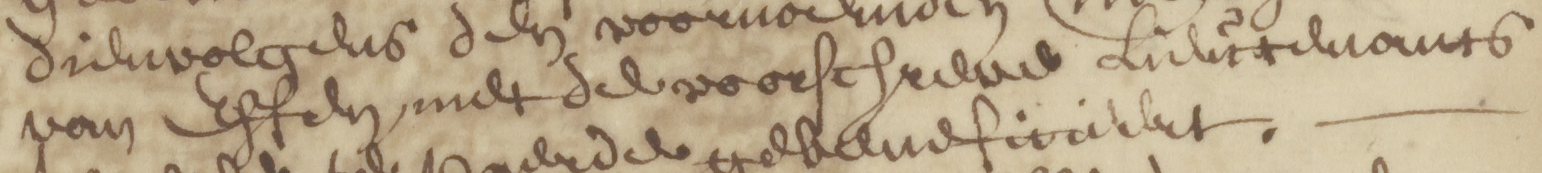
van Effen, met de voorschreve Lieutenants
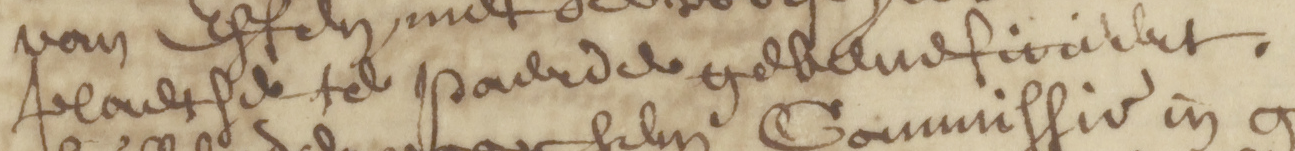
plaetse te paerde gebenificieert.—
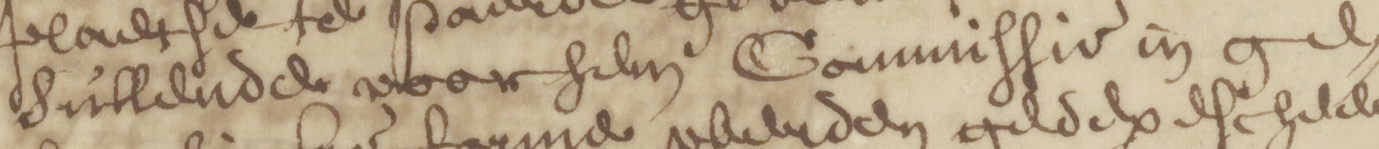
Sullende voor hem Commissie in ge,,
